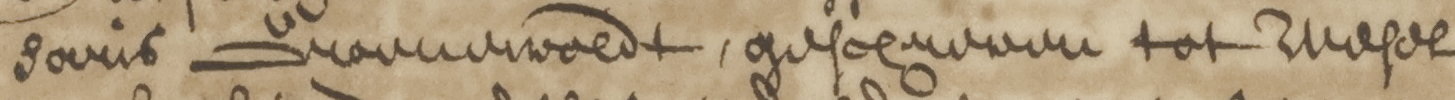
,,saris Groenwoldt, geschreven tot Wesel
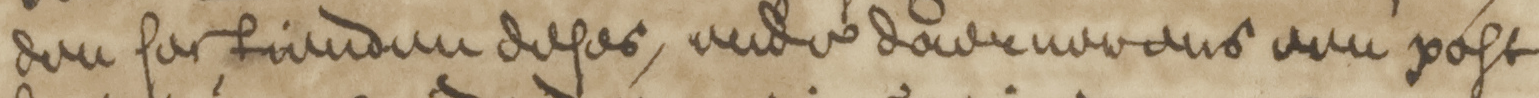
den sestienden deses, ende daernevens een post
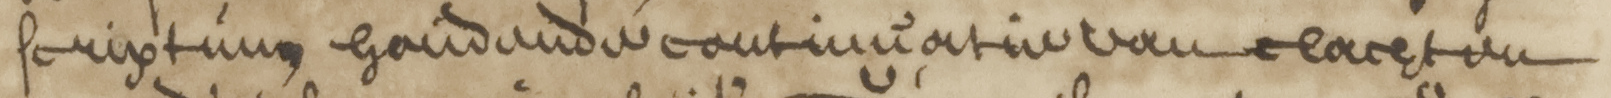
scriptum houdende continuatie van clachten
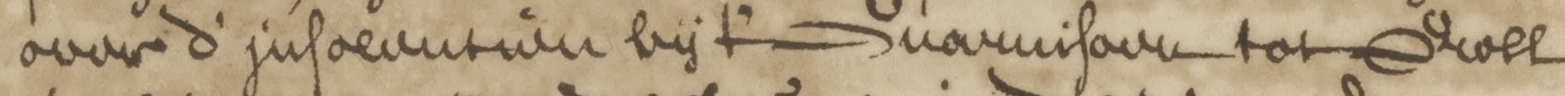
over d'insolentien bij t' Guarnisoen tot Grell
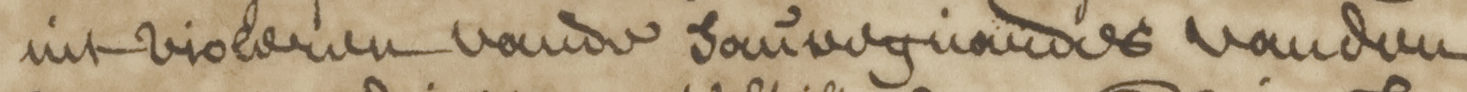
int violeren vande Sauveguardes vanden
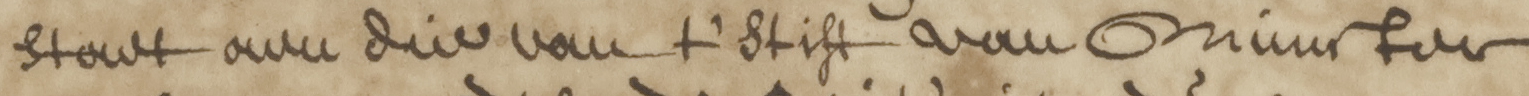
staet aen die van t' Stift van Munster
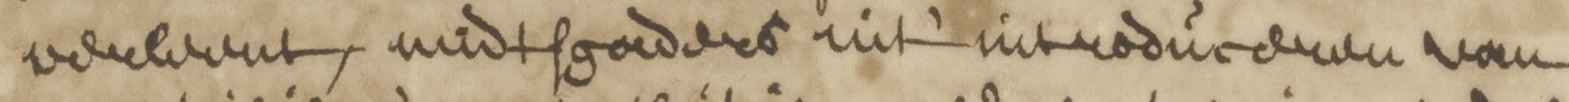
verleent, midtsgaders int' introduceren van
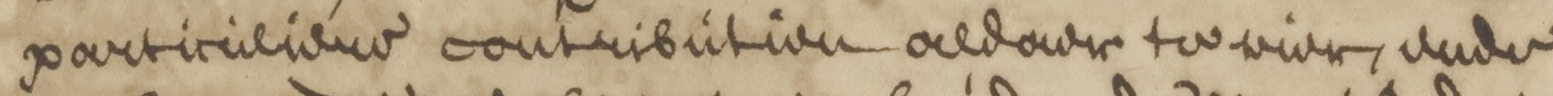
particuliere contributien aldaer te vier, ende
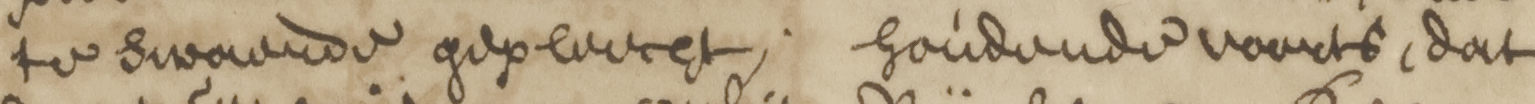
te swaerde gepleecht; houdende voorts, dat
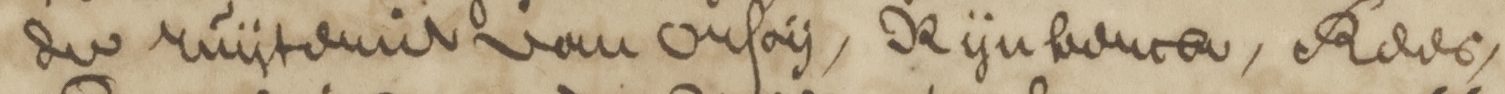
de ruijterie van Orsoij, Rijnberck, Rees,
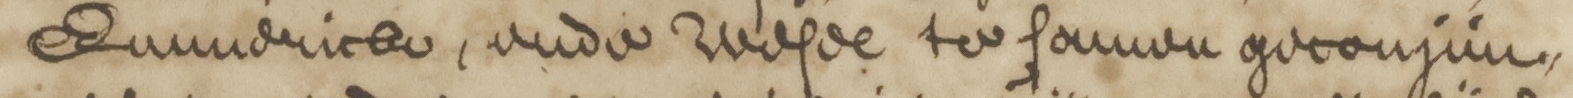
unnerick, ende Wesel te samen geconjun„
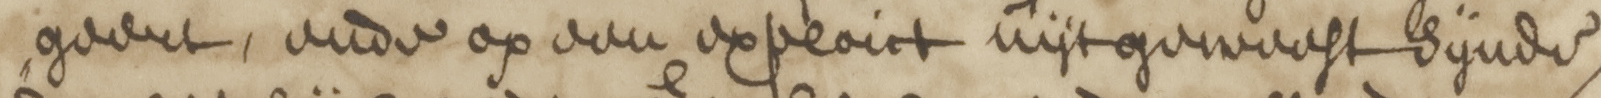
,,geert, ende op een exploict uijtgeweest sijnde
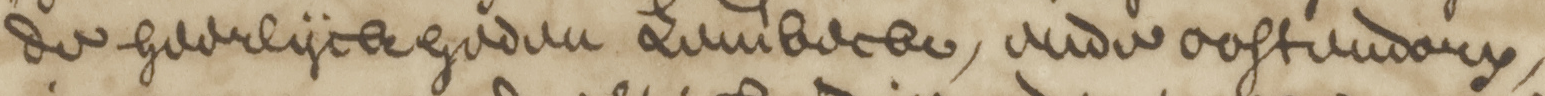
de heerlijckheden Lembeck, ende oostendorp
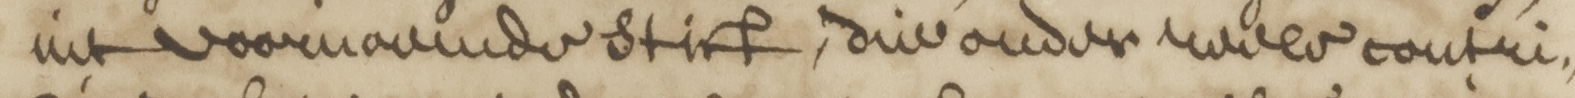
int voornoemde Stiff, die onder reele contri„
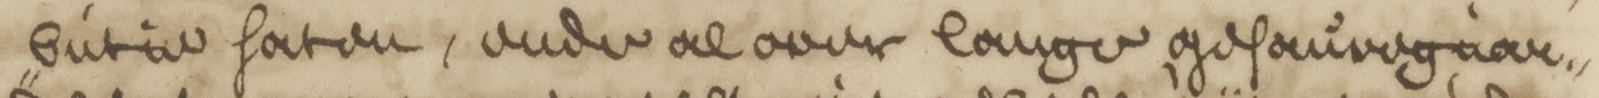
,,butie saten, ende al over lange gesauveguar„
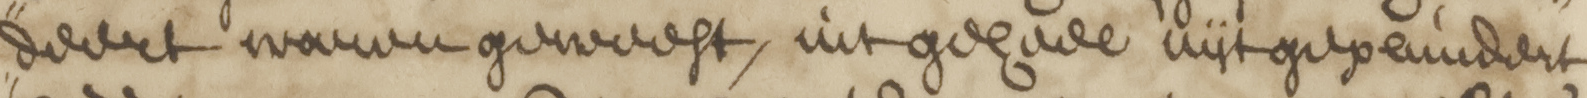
,,deert waren geweest, int geheel uijtgeplundert
